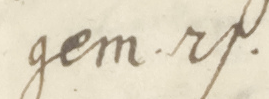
gem etc.
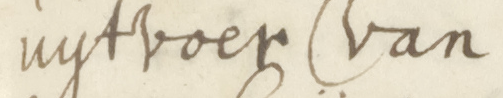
Uijtvoer van
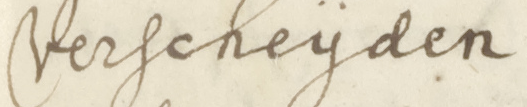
verscheijden
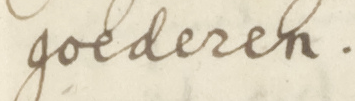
goederen.
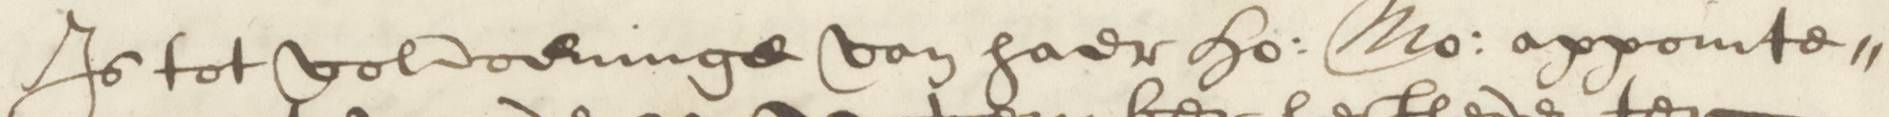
Is tot voldoeninge van haer Ho:Mo: appointe„
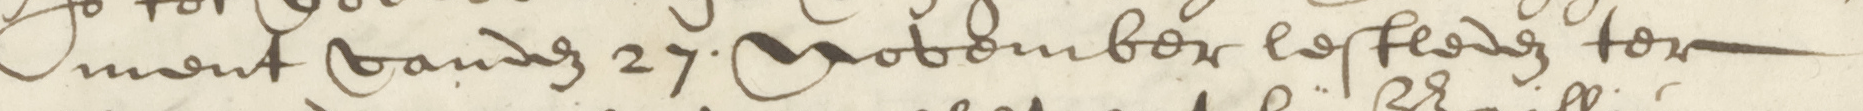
ment vanden 27· November lestleden ter
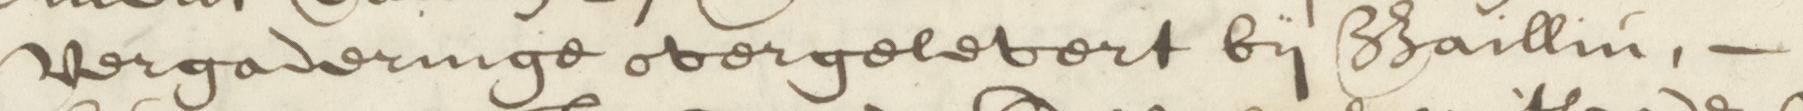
Vergaderinge overgelevert bij Bailliu, —
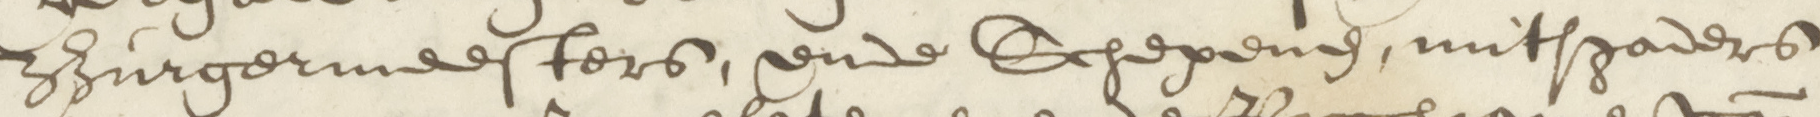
Burgermeesters, ende Schepenen, mitsgaders
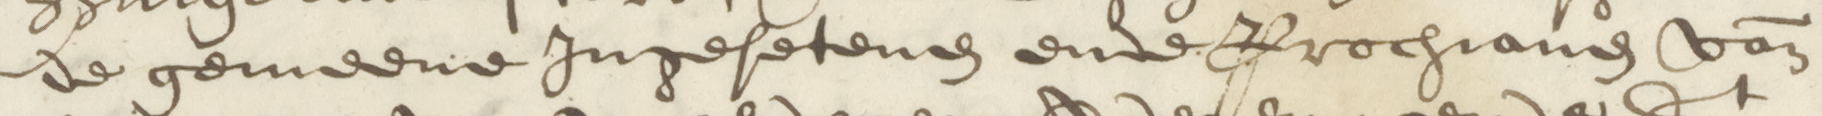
de gemeene Ingesetenen ende Prochianen van
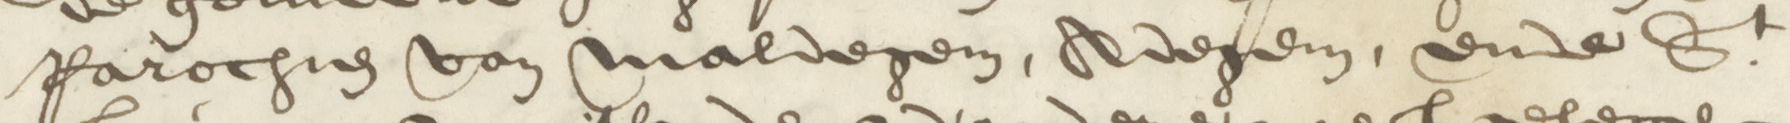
parochien van Maldegem, Adegem, ende St.
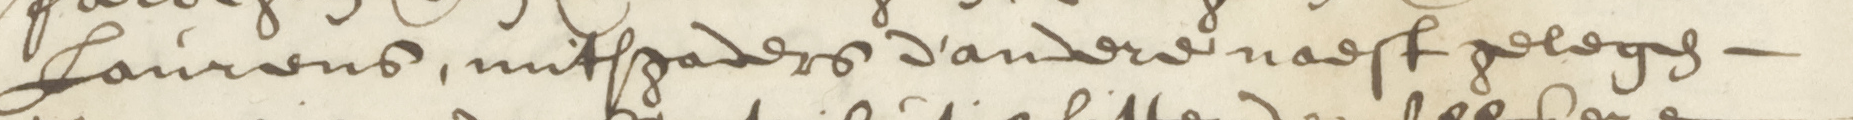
Laurens, mitsgaders d'andere naest gelegen —
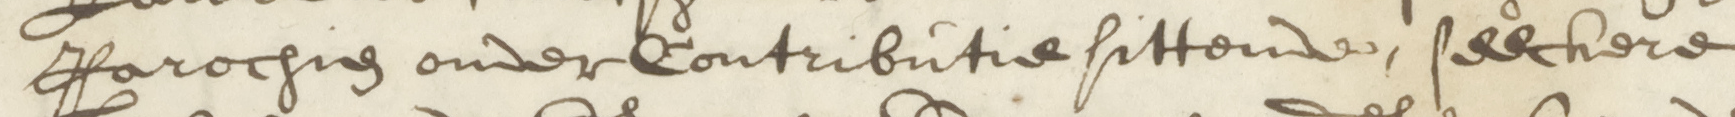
parochien onder Contributie sittende, seeckere
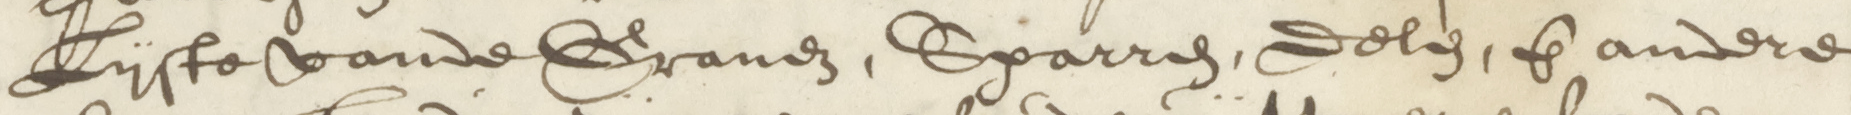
Lijste vande Granen, Sparren, Delen, & andere
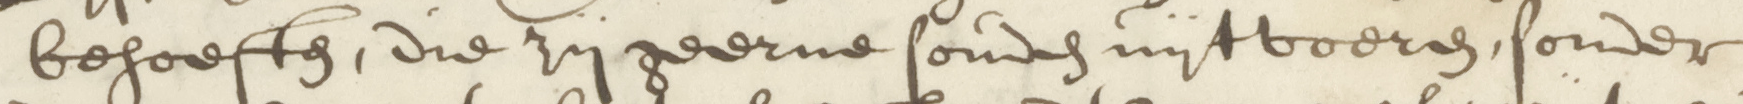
behoeften, die zij geerne souden uijtvoeren, sonder
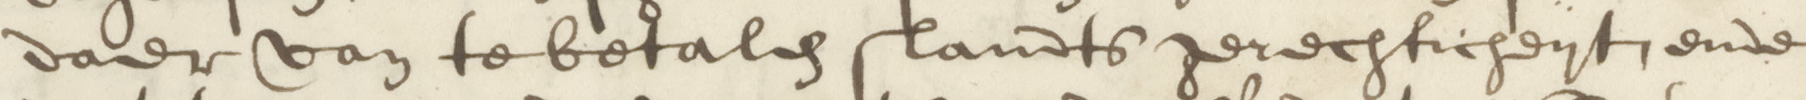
daer van te betalen slandts gerechticheijt, ende
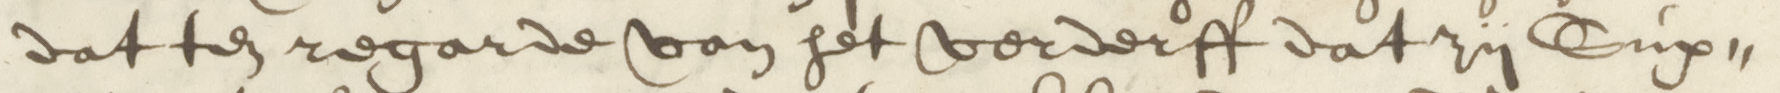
dat ten regarde van het verderff dat zij Sup„
